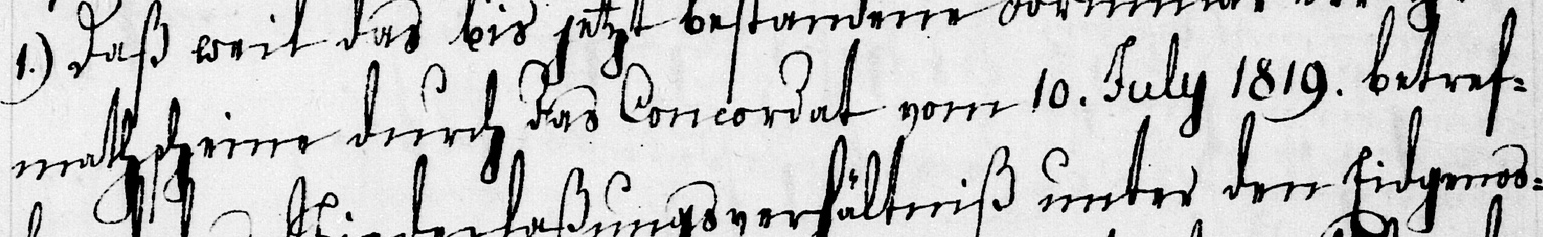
mathscheine durch das Concordat vom 10. July 1819. betref¬
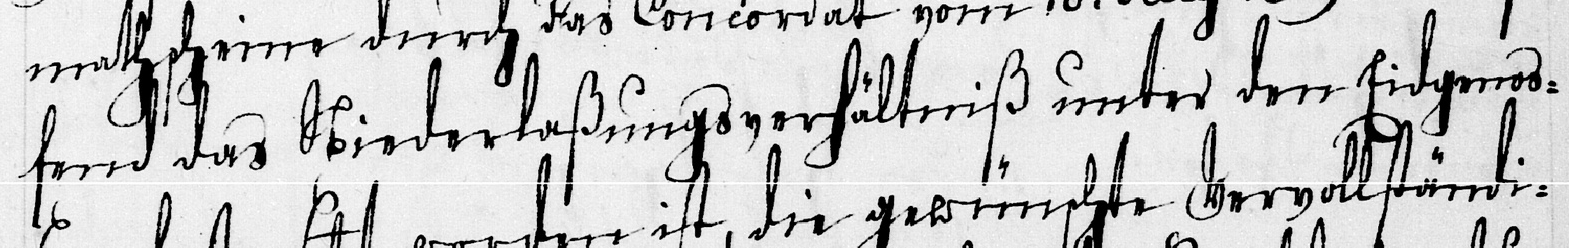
fend das Niederlaßungsverhältniß unter den Eidgenoß¬
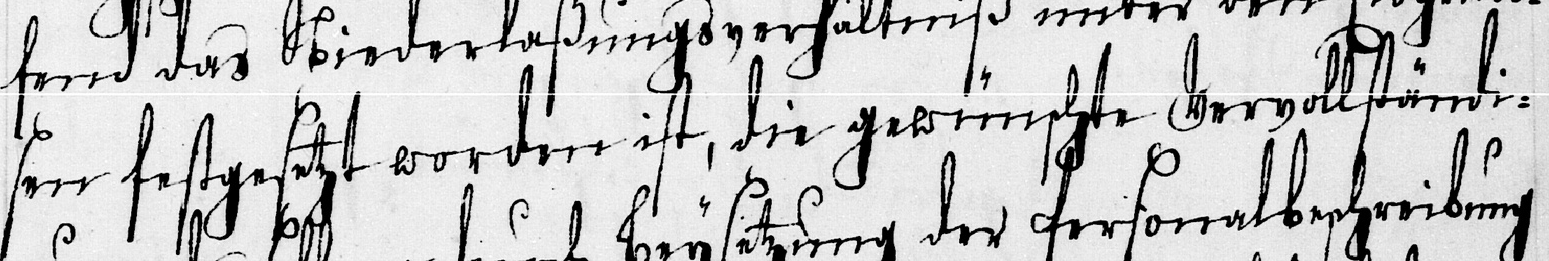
en festgesetzt worden ist, die gewünschte Vervollständi¬
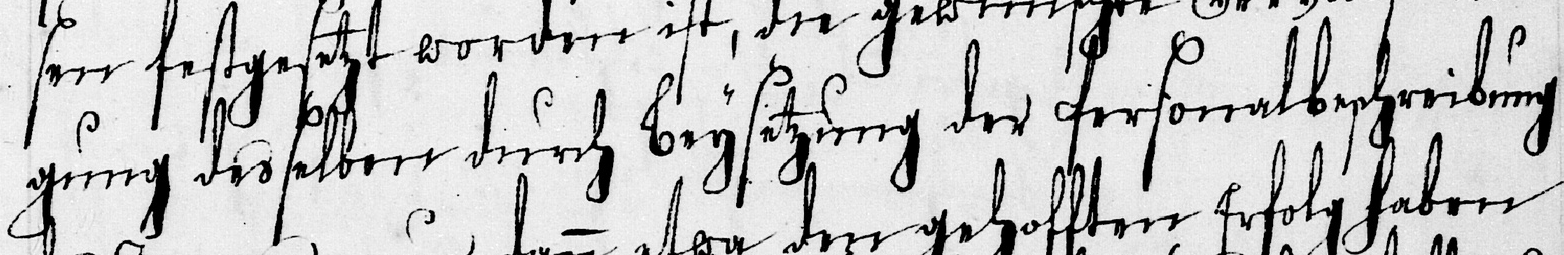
gung derselben durch Beysetzung der Personalbeschreibung
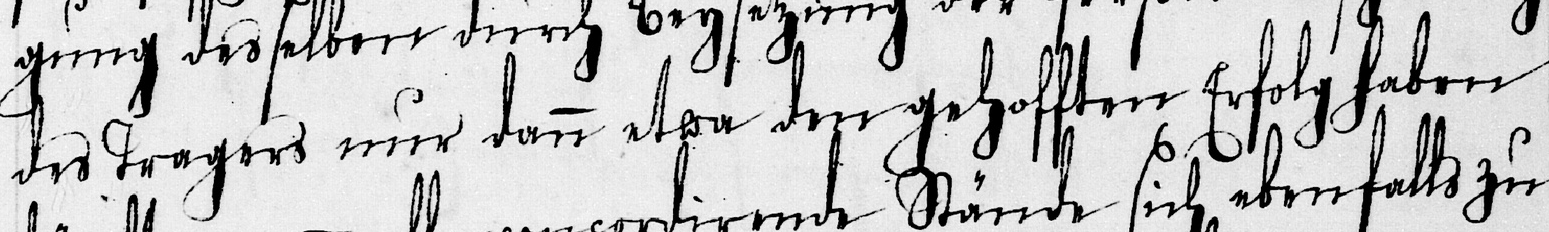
des Tragers nur dann etwa den gehofften Erfolg haben
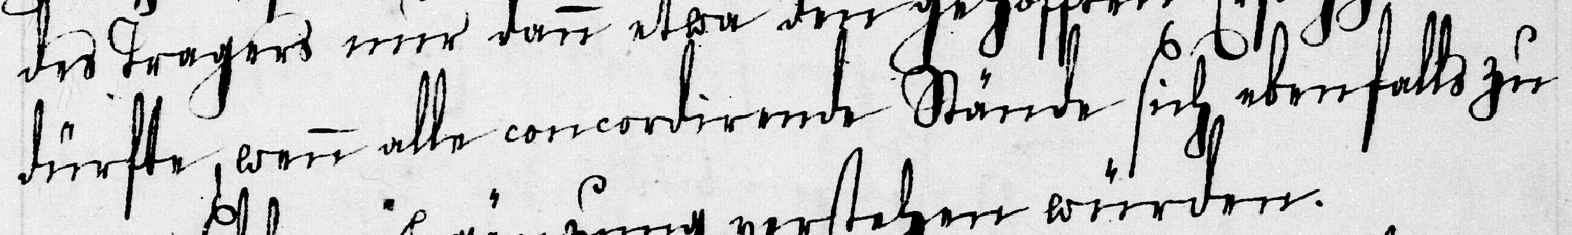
dürfte, wenn alle concordirende Stände sich ebenfalls zu
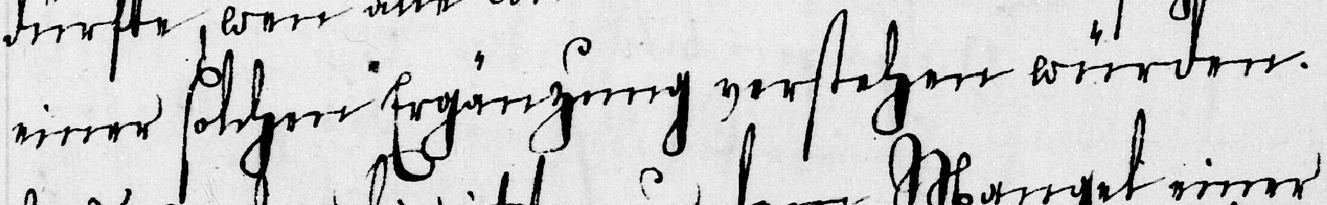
einer solchen Ergänzung verstehen würden.
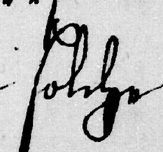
solche
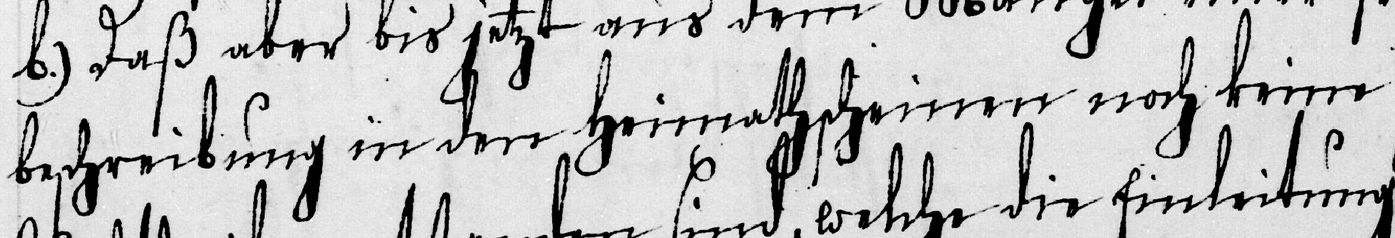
beschreibung in den Heimathscheinen noch keine
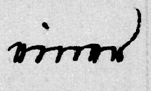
einer
